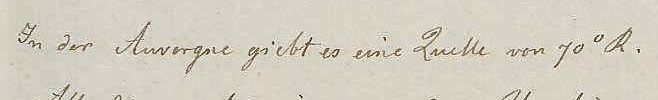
In der Auvergne giebt es eine Quelle von 70° R.
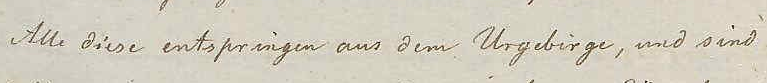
Alle diese entspringen aus dem Urgebirge, und sind
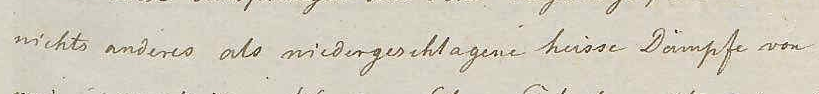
nichts anderes als niedergeschlagene heisse Dämpfe von
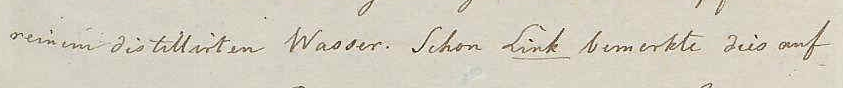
reinem distillirten Wasser. Schon Link bemerkte dies auf
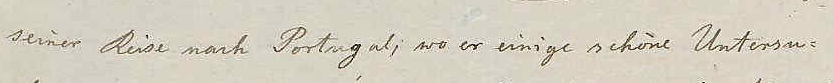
seiner Reise nach Portugal, wo er einige schöne Untersu-
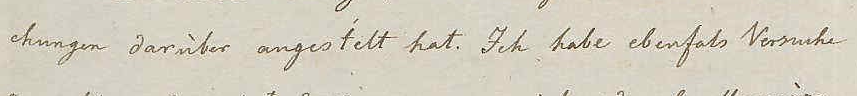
chungen darüber angestelt hat. Ich habe ebenfals Versuche
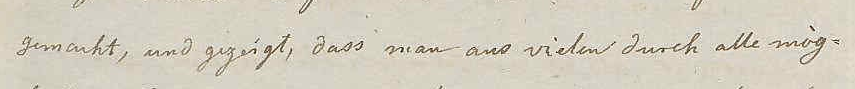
gemacht, und gezeigt, dass man aus vielen durch alle mög-
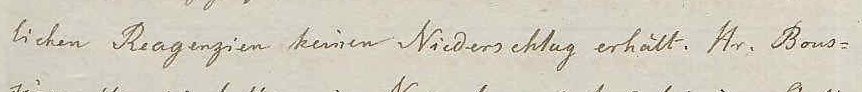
lichen Reagenzien keinen Niederschlag erhält. Hr. Bous-
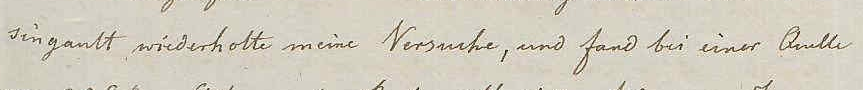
singault wiederholte meine Versuche, und fand bei einer Quelle
